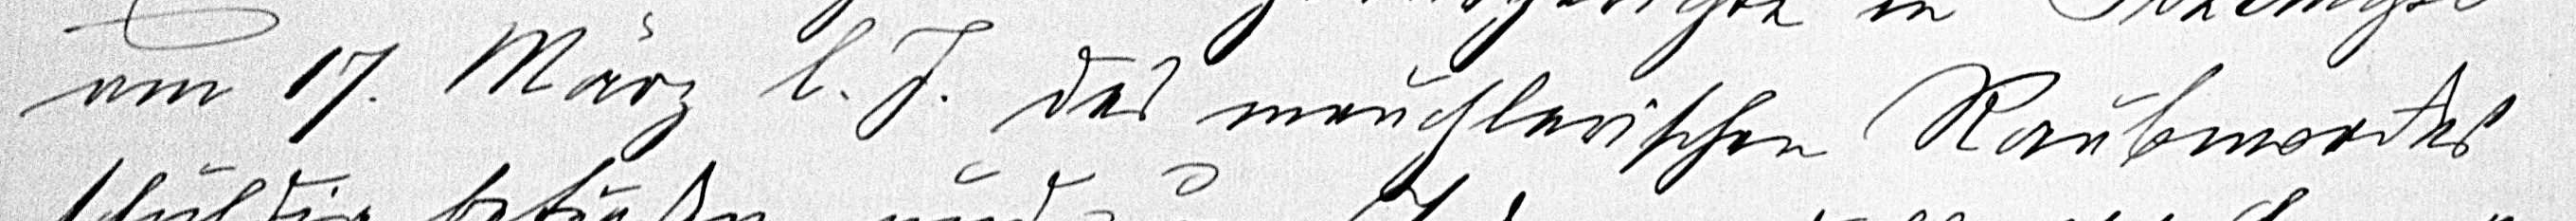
am 17. März l. J. des meuchlerischen Raubmordes
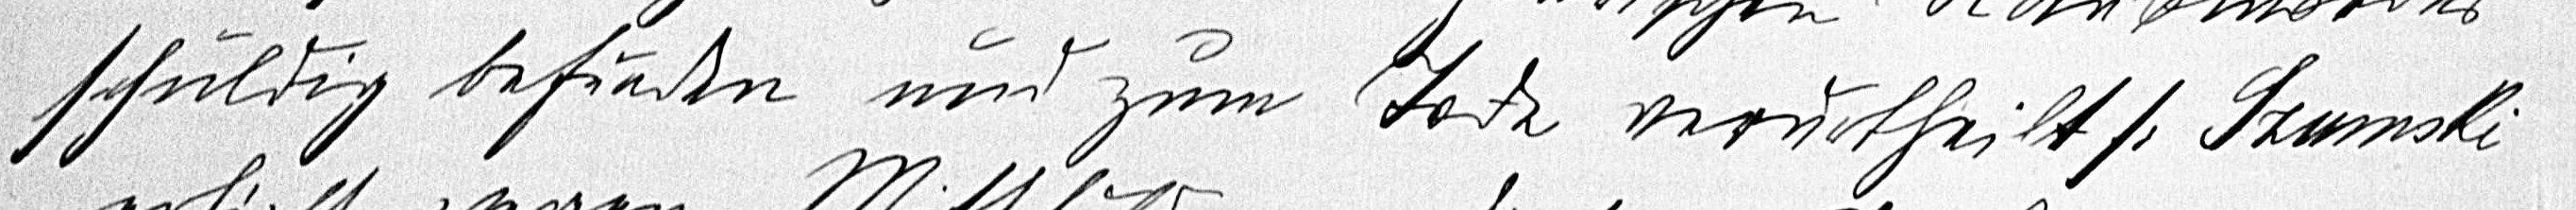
schuldig befxxden und zum Tode verurtheilt /: Szumski
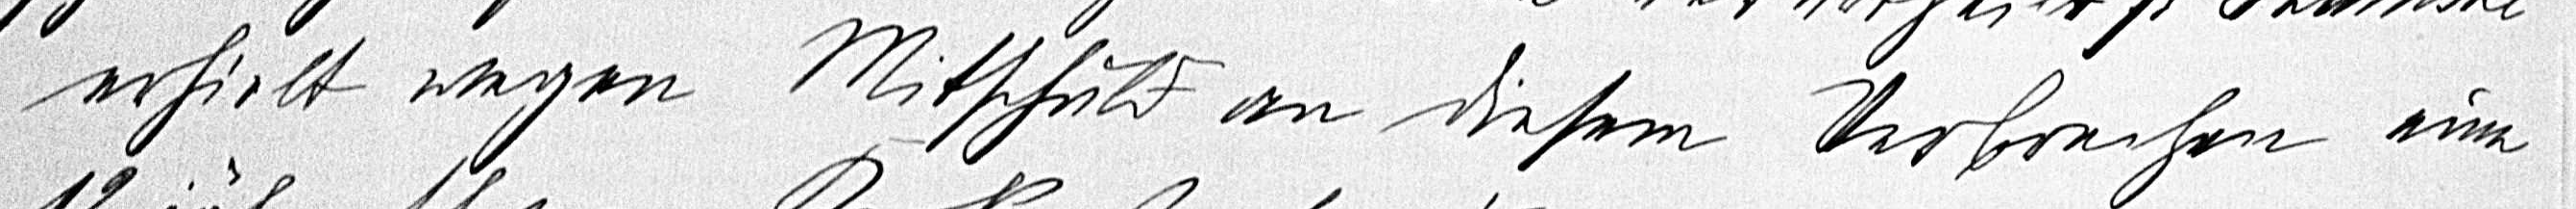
erhielt wegen Mitschuld an diesem Verbrechen eine
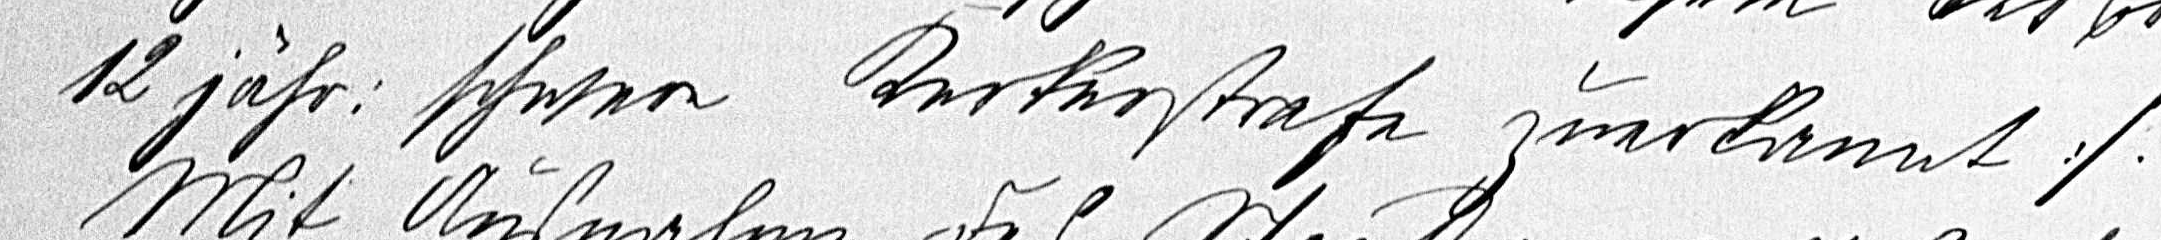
12 jähr: schwere Kerkerstrafe zuerkannt :/
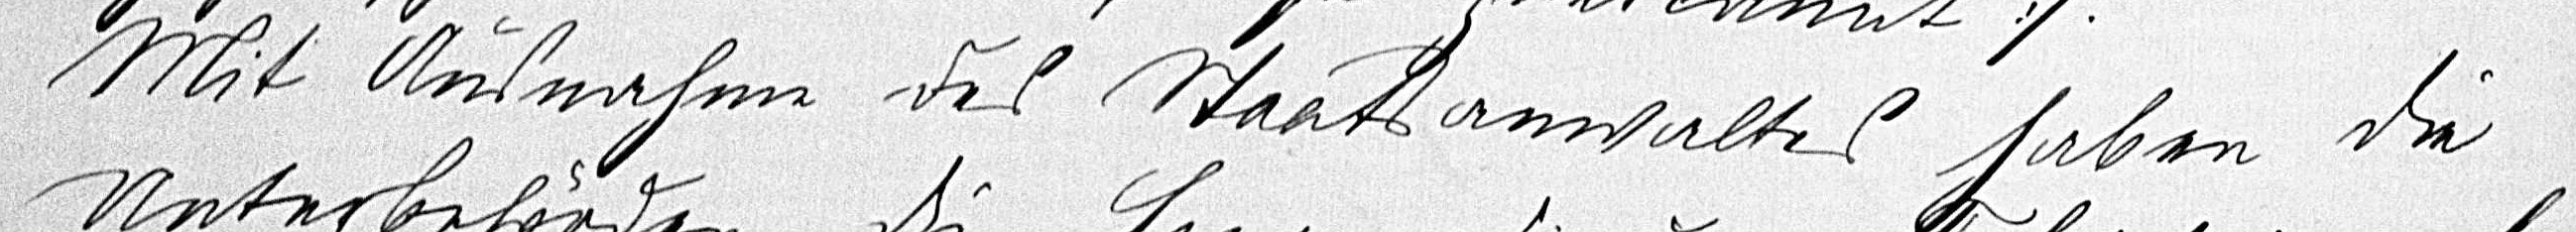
Mit Ausnahme des Staatsanwaltes haben die
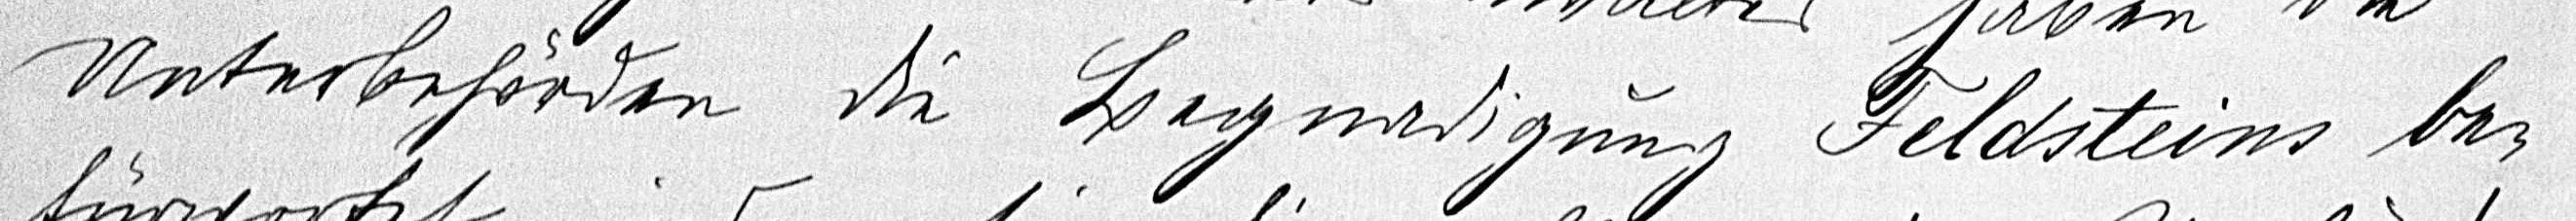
Unterbehörden die Begnadigung Feldsteins be¬
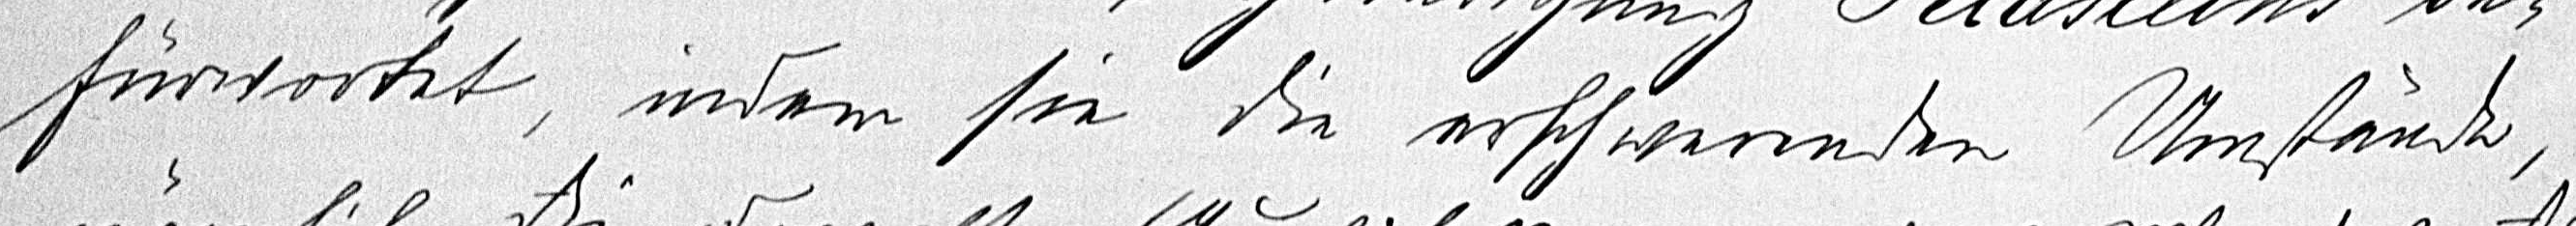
fürwortet, indem sie die erschwerenden Umstände,
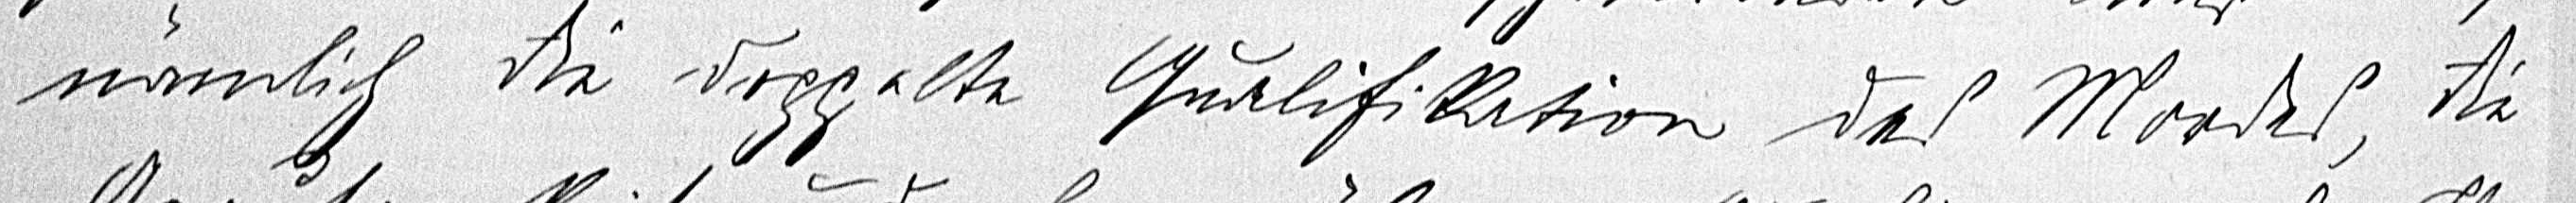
nämlich die doppelte Qualifikation des Mordes, die
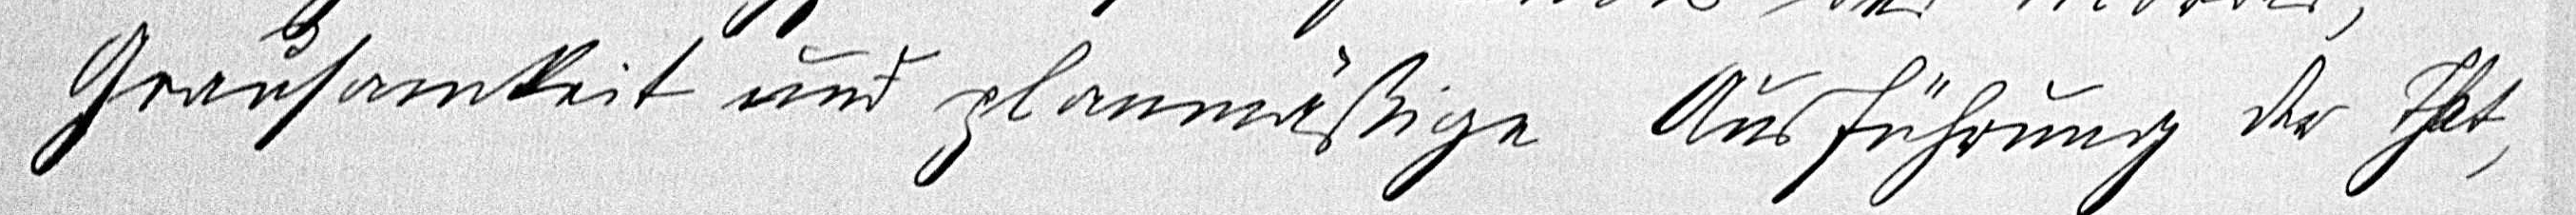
Grausamkeit und planmäßige Ausführung der That,
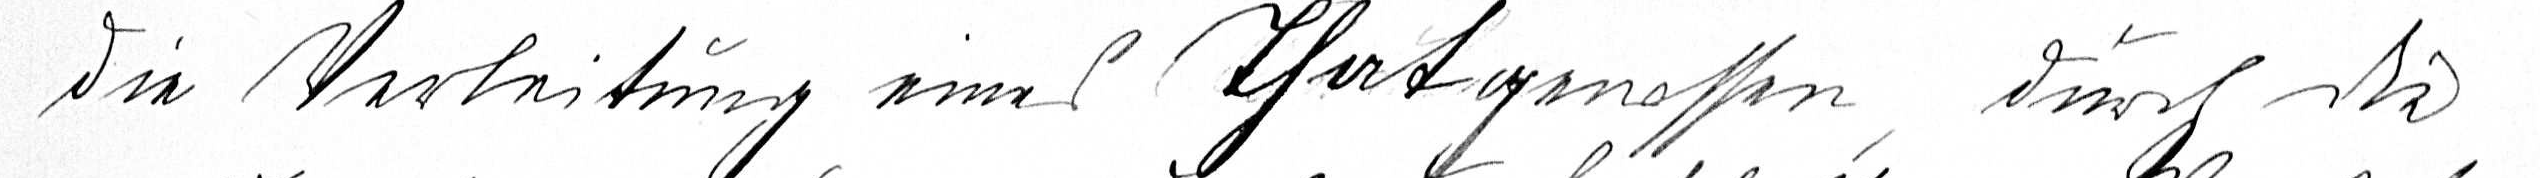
die Verleitung eines That genossen, durch die
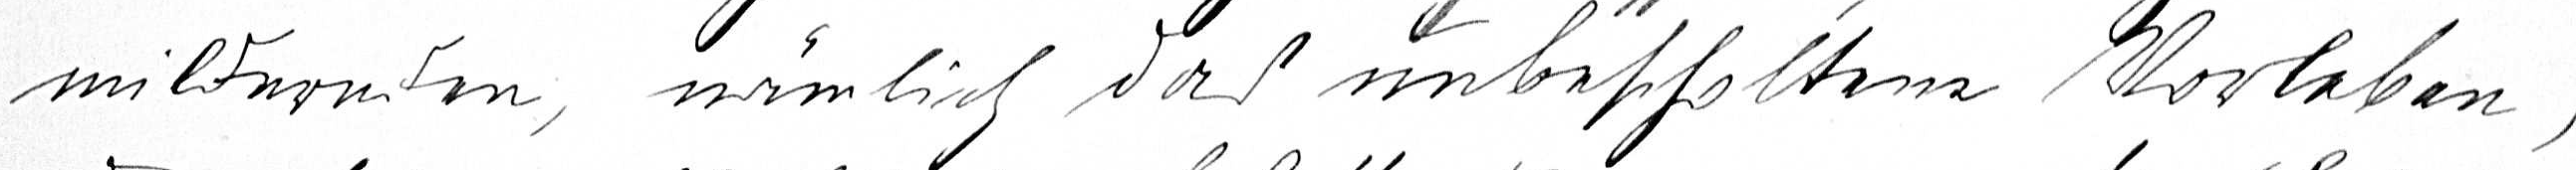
mildernden, nämlich das unbescholtene Vorleben,
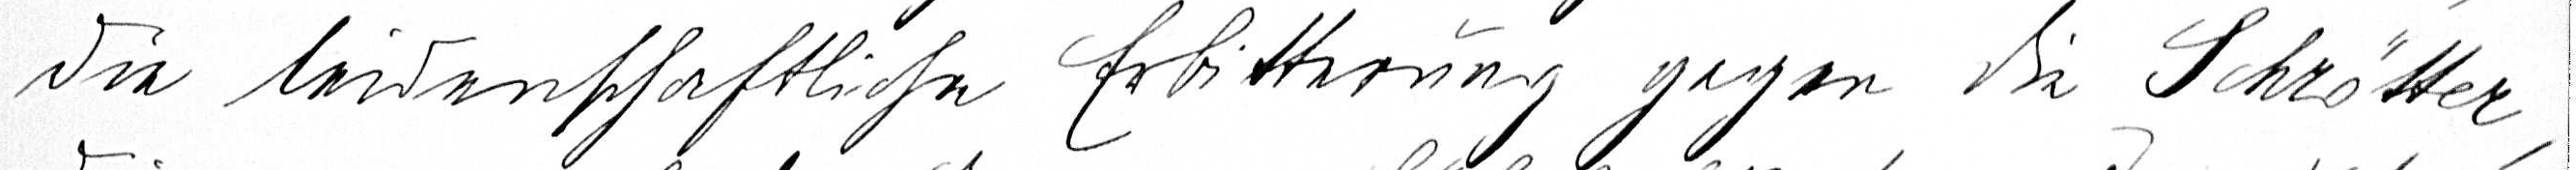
die leidenschaftliche Erbitterung gegen die Schrötter,
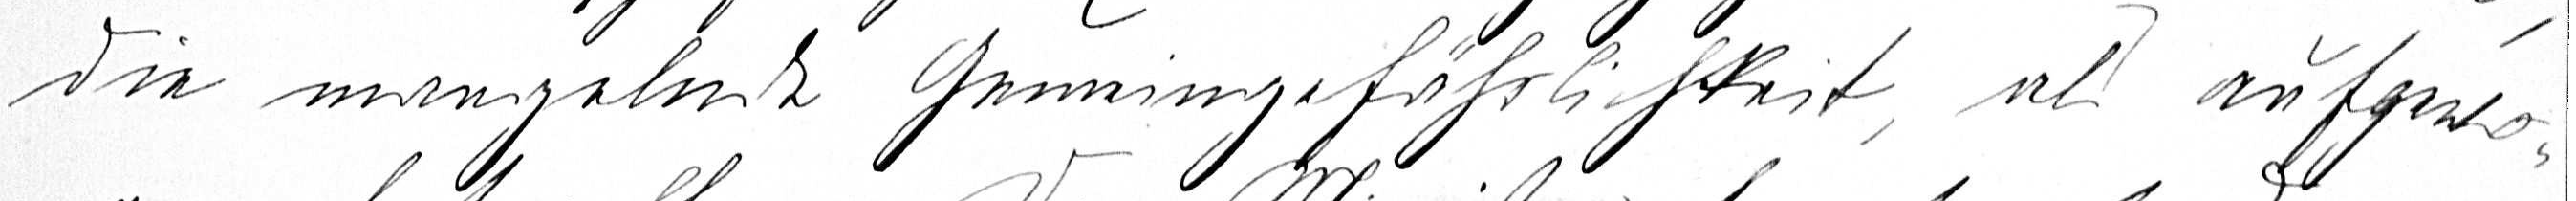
die mangelnde Gemeingefährlichkeit, als aufgewo¬
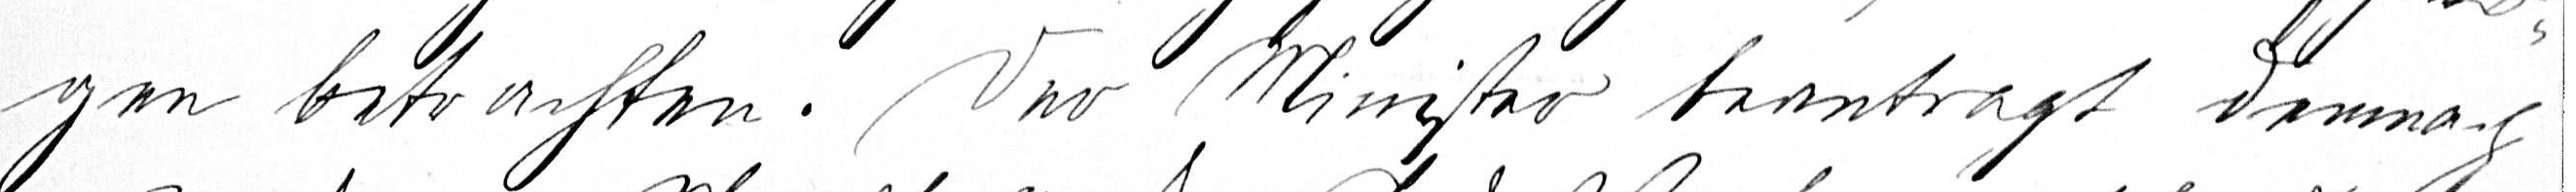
gen betrachten. Der Minister beantragt denach
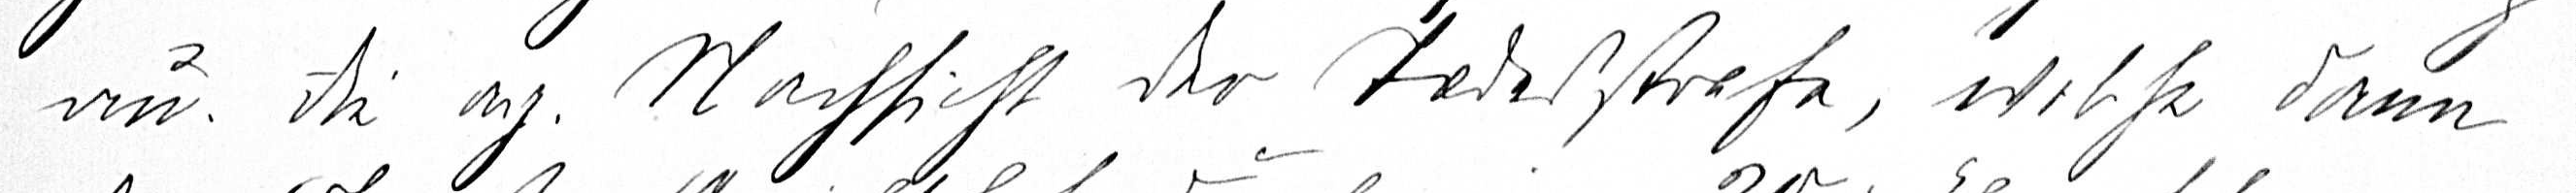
au. Die xx Nachsicht der Todesstrafe, welche dann
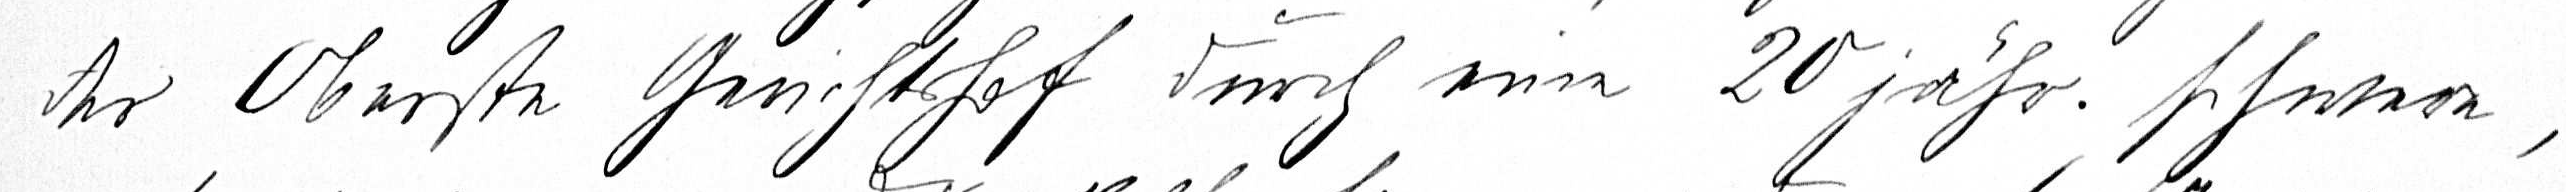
der Oberste Gerichtshof durch eine 20 jähr. schwere,
